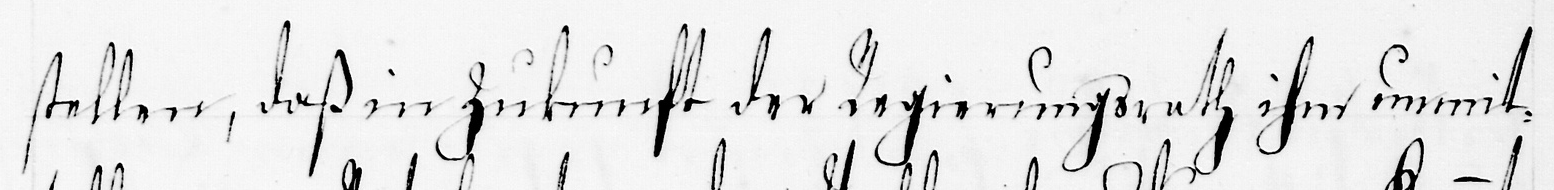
stellen, daß in Zukunft der Regierungsrath ihm unmit¬
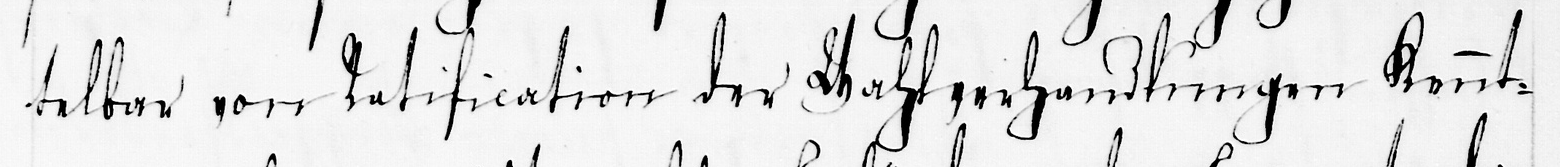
telbar von Ratification der Wahlverhandlungen Kennt¬
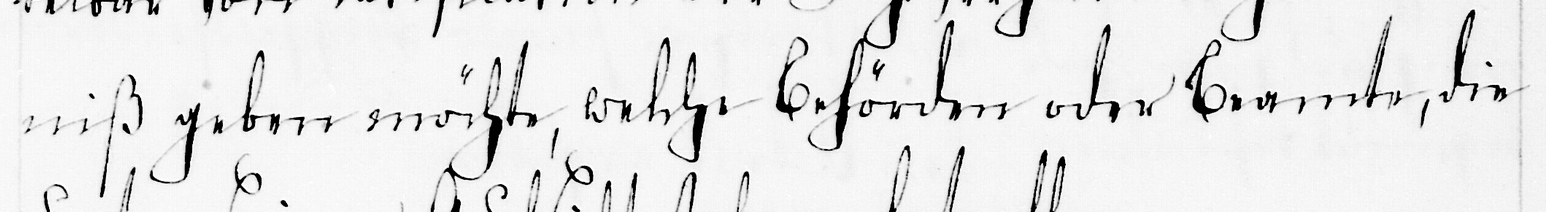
niß geben möchte, welche Behörden oder Beamte, die
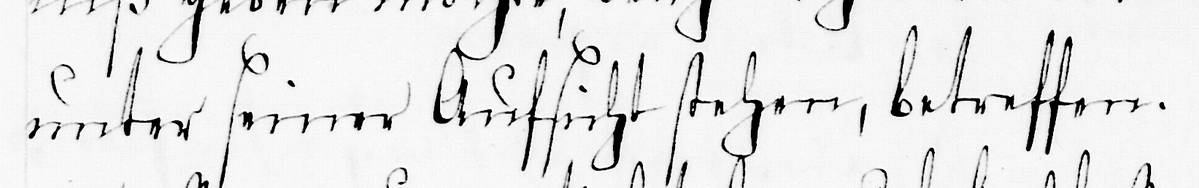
unter seiner Aufsicht stehen, betreffen.
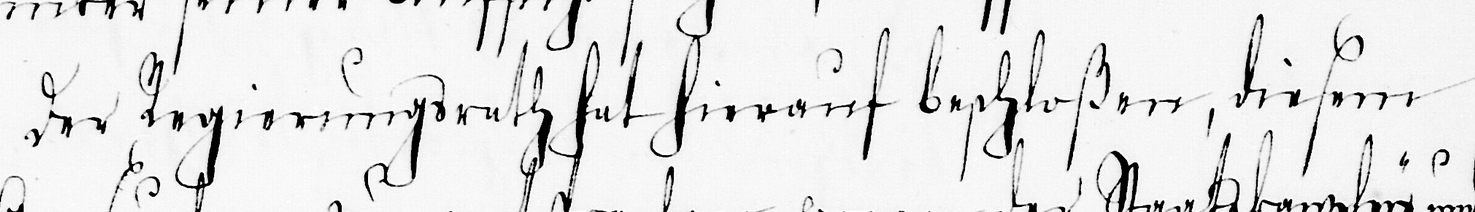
Der Regierungsrath hat hierauf beschloßen, diesem
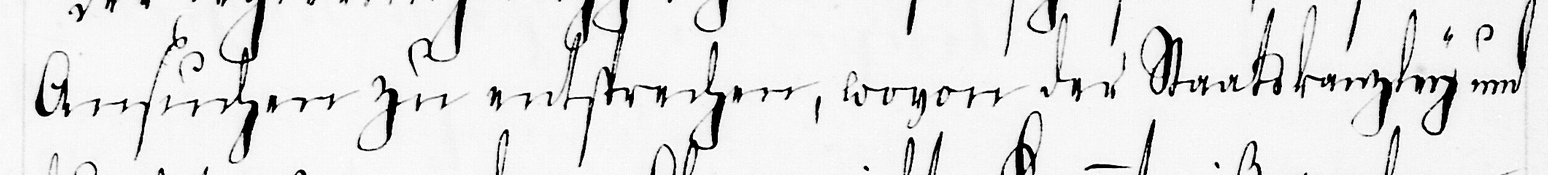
Ansuchen zu entsprechen, wovon der Staatskanzley und
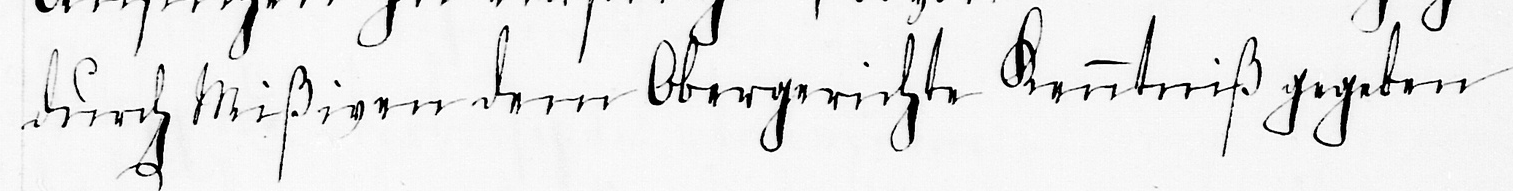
durch Mißiven dem Obergerichte Kenntniß gegeben
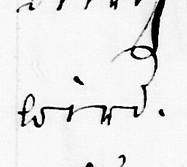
wird.
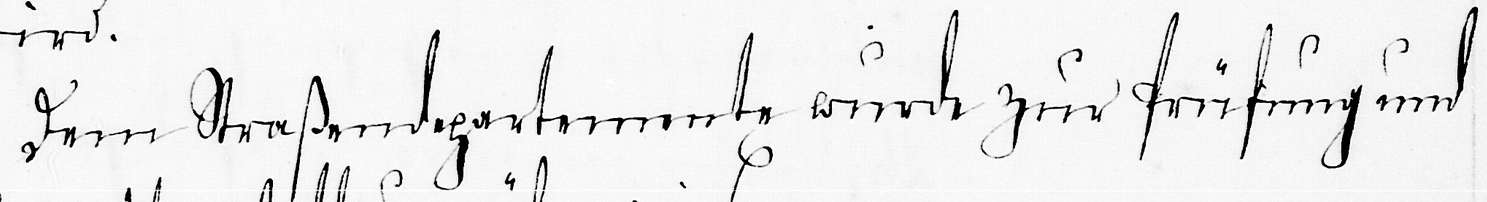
Dem Straßendepartemente wurde zur Prüfung und
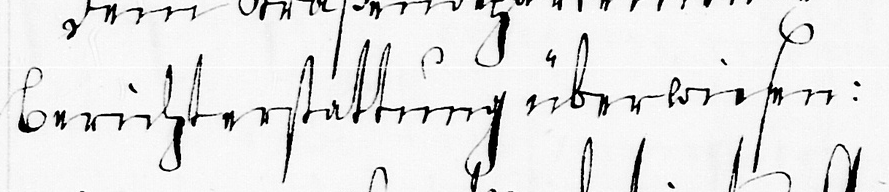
Berichterstattung überwiesen:
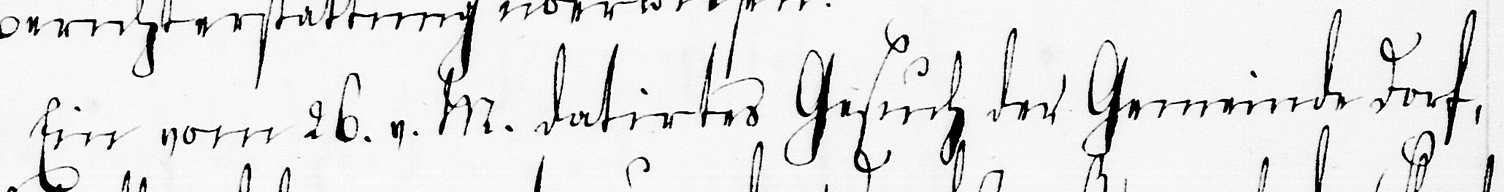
Ein vom 26. v. M. datirtes Gesuch der Gemeinde Dorf,
